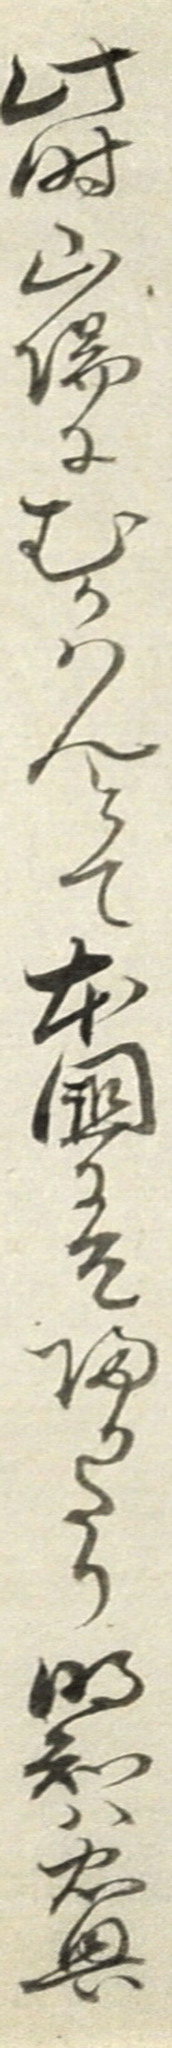此時山陽にむかはんとて本国にそ帰りたり明知は忠興
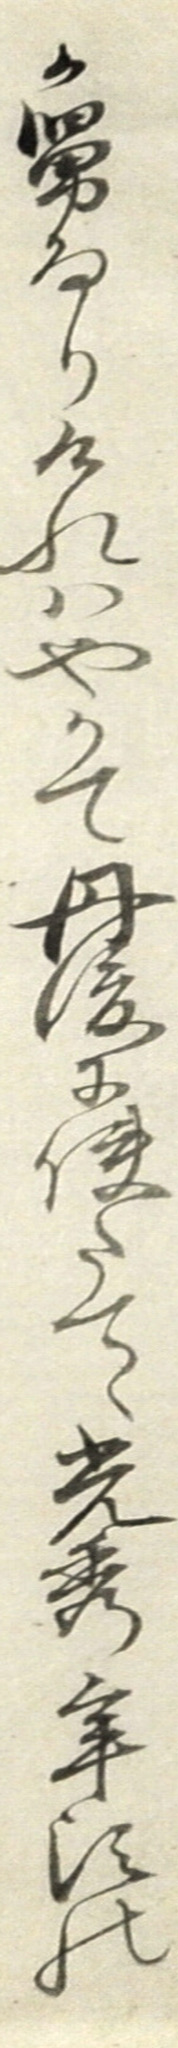か舅なりけれはやかて丹後に使たてゝ光秀年頃の
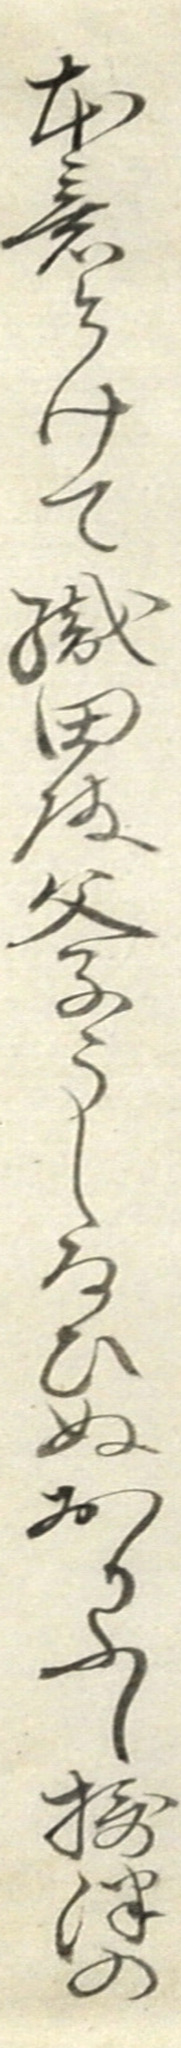本意とけて織田殿父子うしなひぬおりふし摂津の
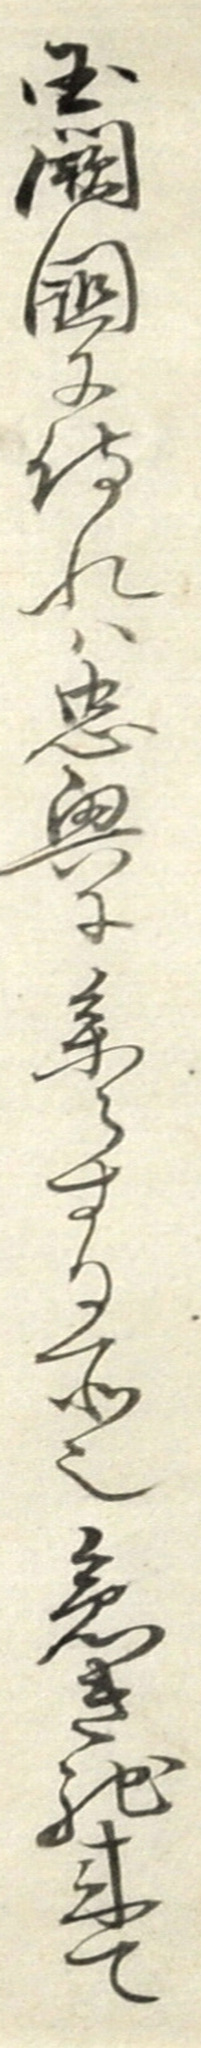国闕国に侍れは忠興に参らする所也急き馳来て
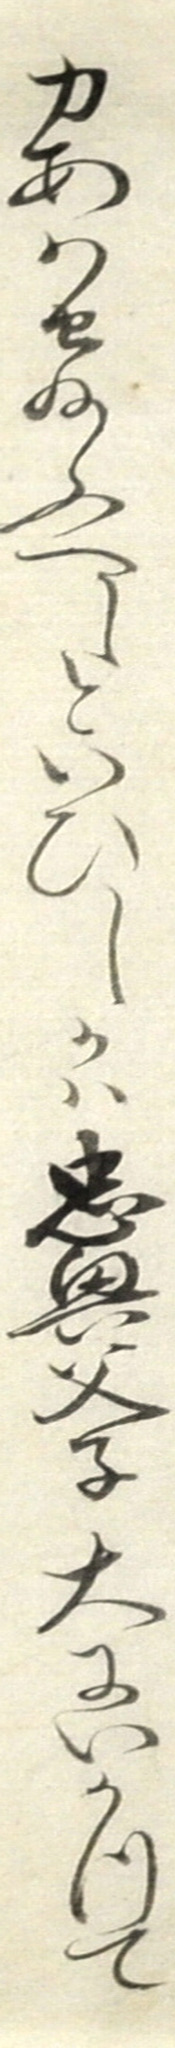力あはせ給ふへしといひしかは忠興父子大にいかつて
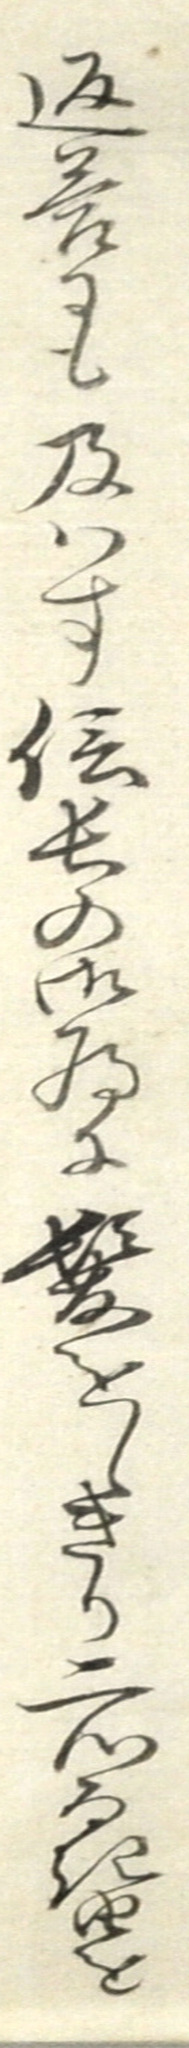返答にも及はす信長の御為に髪をしきり二心なき由を
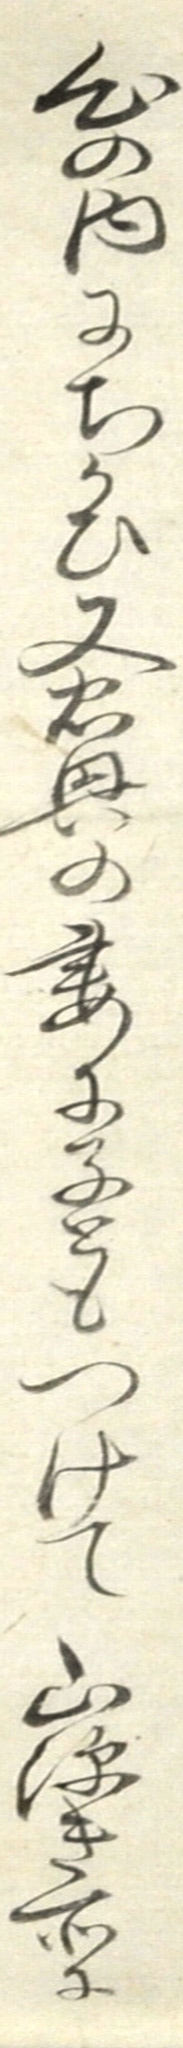心の内にちかひ又忠興の妻に子ともつけて山深き所に
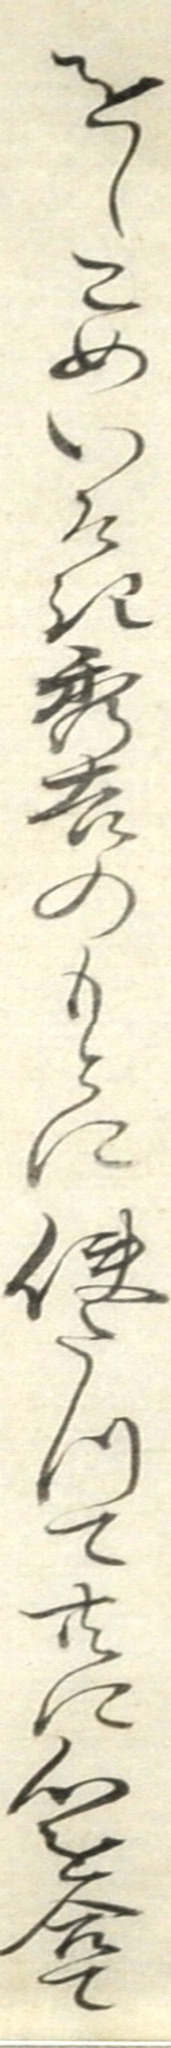をしこめいそき秀吉のもとに使たつて共に心を合て
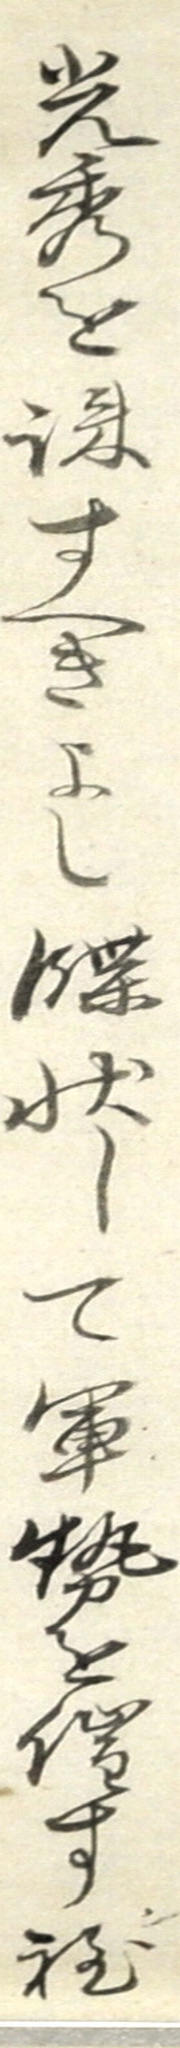光秀を誅すへきよし牒状して軍勢を催す程
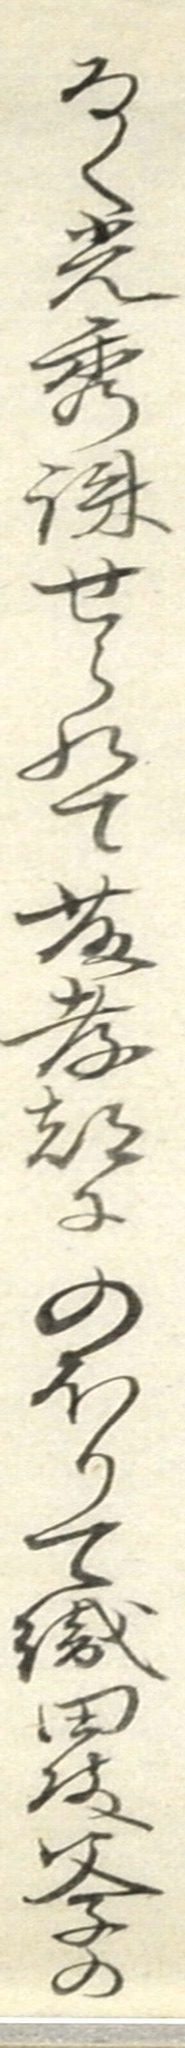なく光秀誅せられて藤孝都にのほりて織田殿父子の
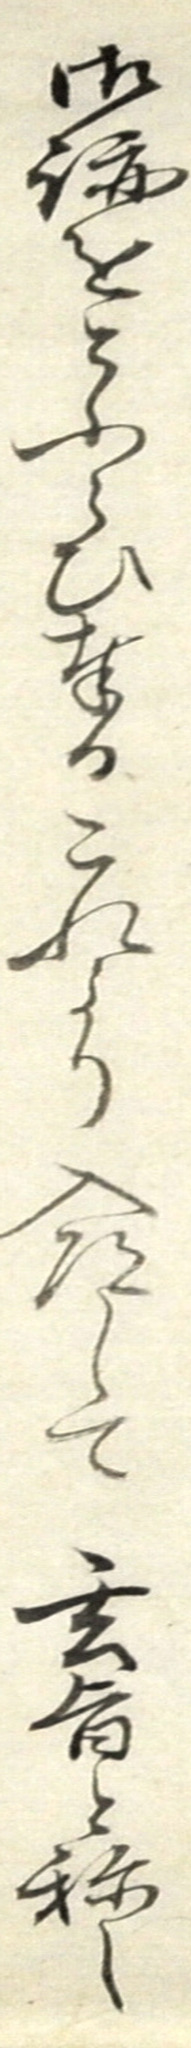御跡をとふらひ奉るこれより入道して玄旨と称し
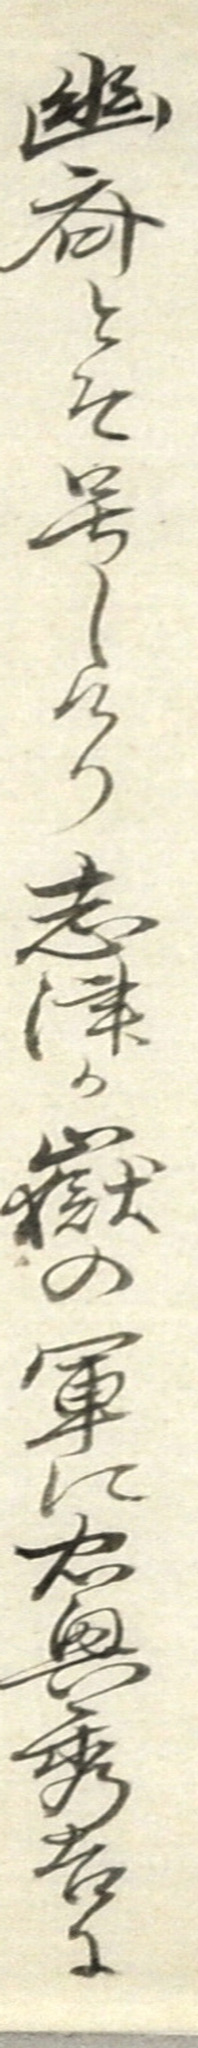幽斉とそ号しけり志津か嶽の軍に忠興秀吉に
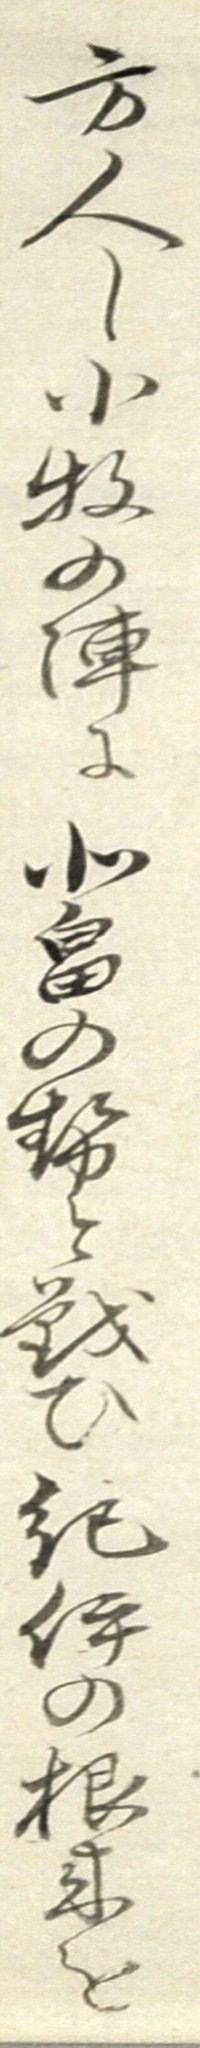方人し小牧の陣に北畠の勢と戦ひ紀伊の根来を
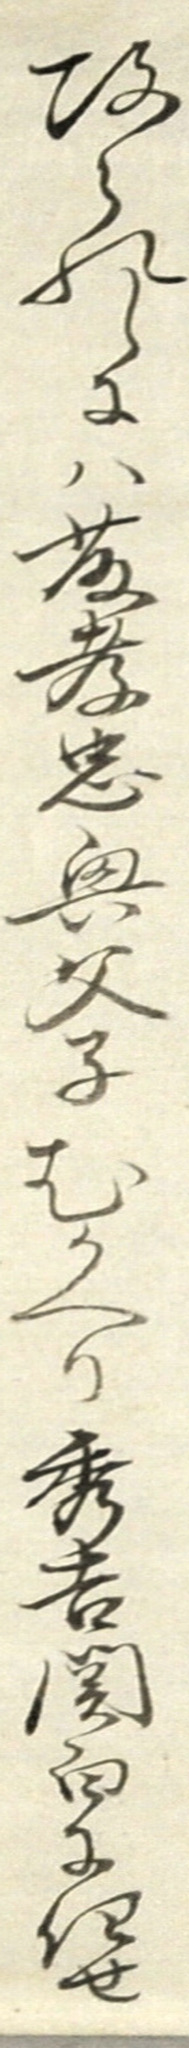攻られしには藤孝忠興父子むかへり秀吉関白に任せ
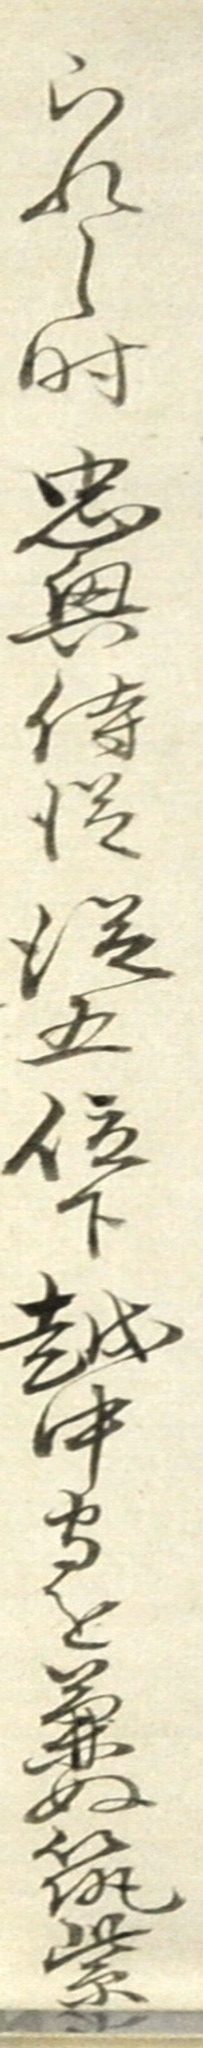られし時忠興侍従従五位下越中守を兼ぬ筑紫
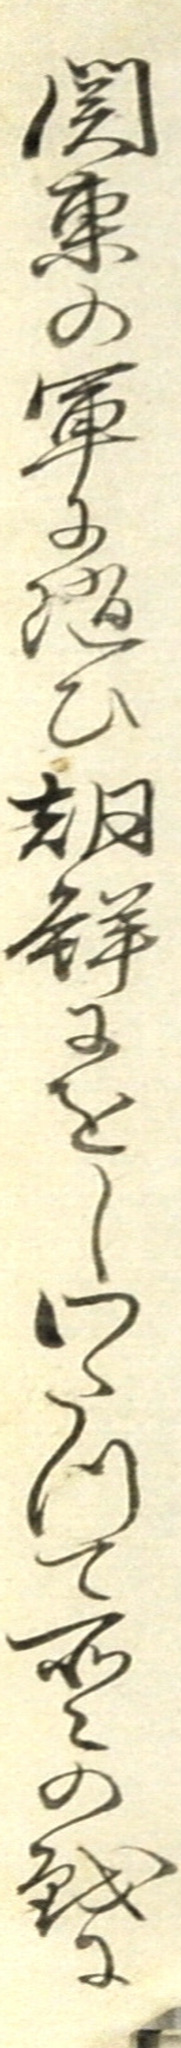関東の軍に随ひ朝鮮にをしわたつて所々の戦に
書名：藩翰譜（七・下）
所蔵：伊那市立高遠町図書館・合同会社AMANE
